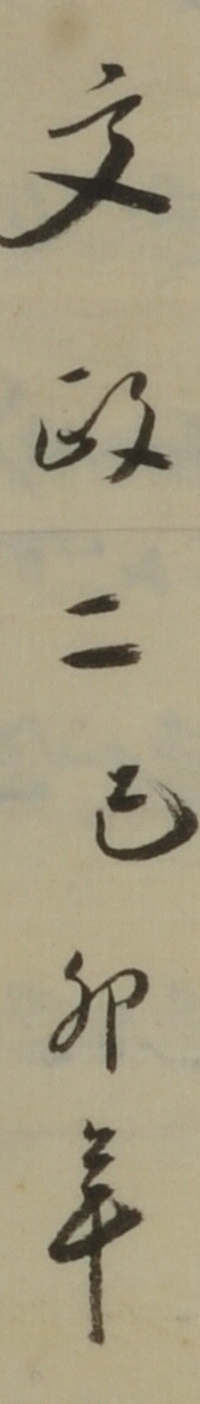文政二己卯年
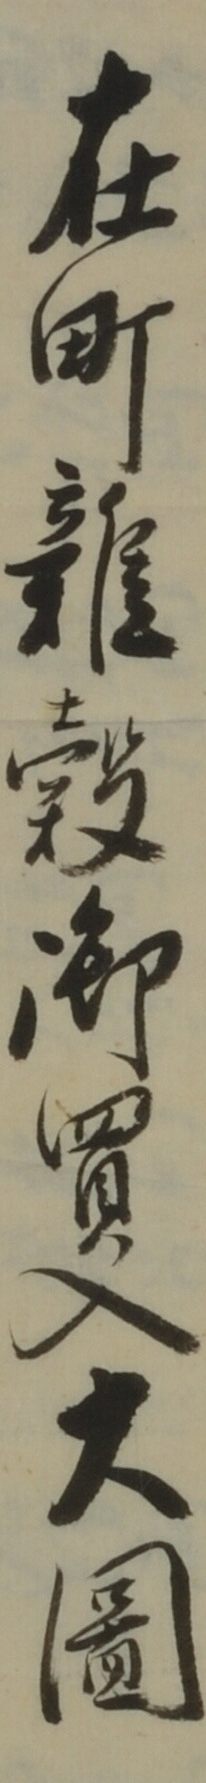在町雑穀御買入大図

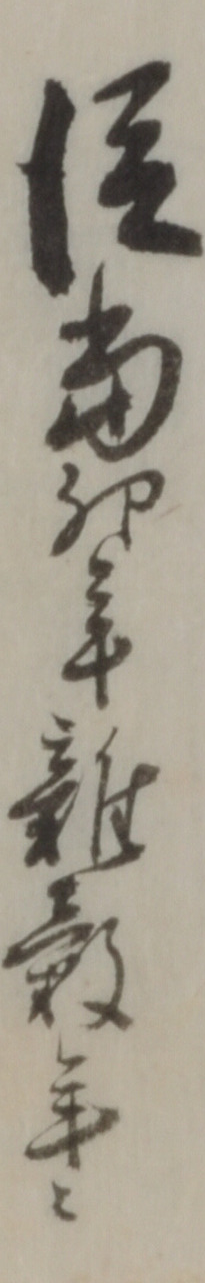従当卯年雑穀年々
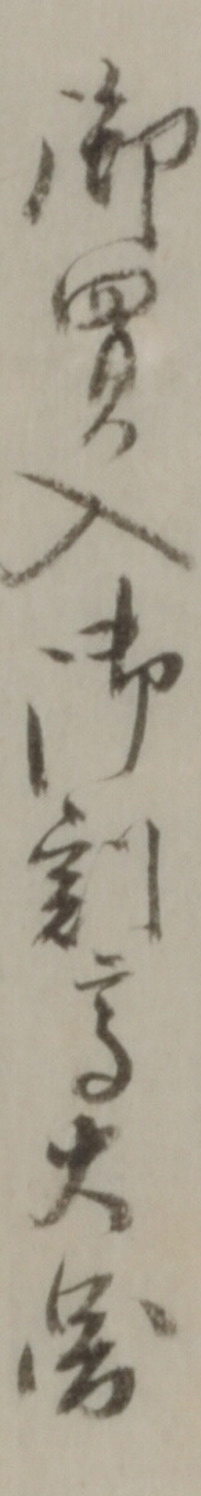御買入御割高大図
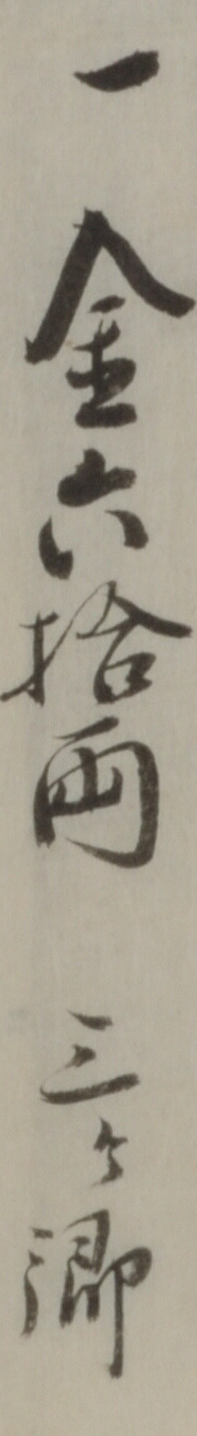一金六拾両三ヶ郷
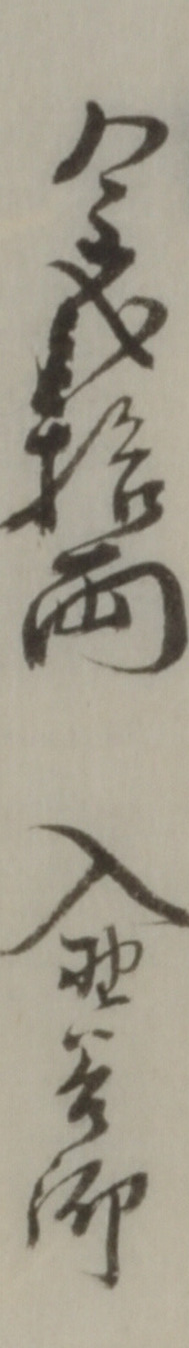金弐拾両入野谷郷
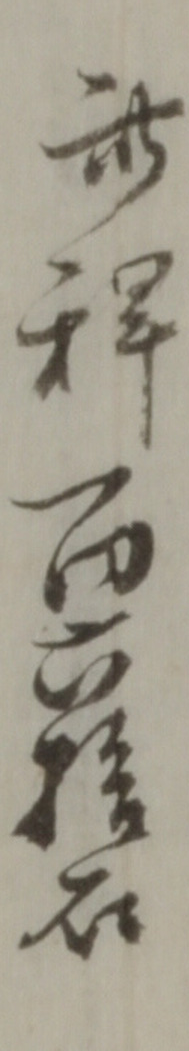此稈三百六拾石
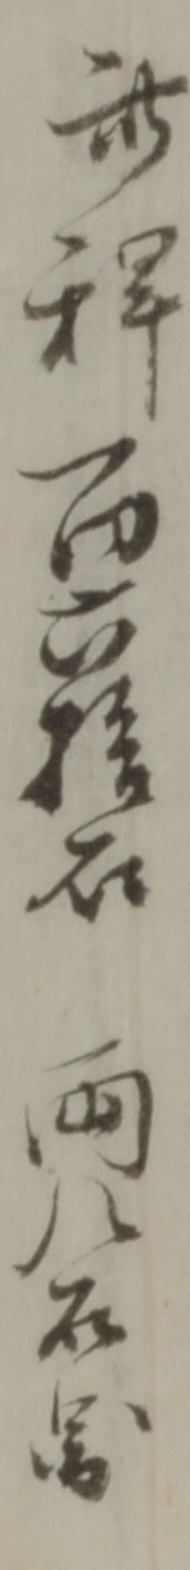此稈百六拾石両八石図
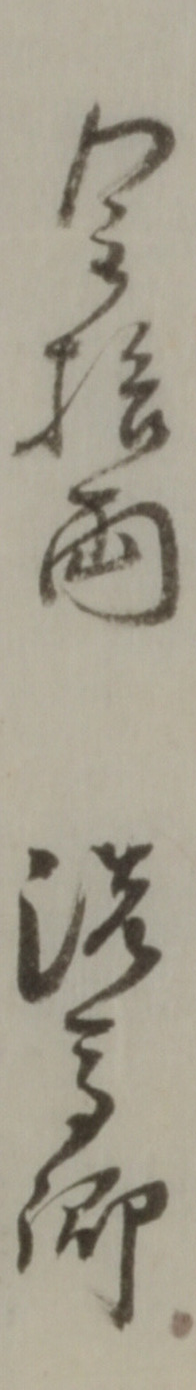金拾両洗馬郷
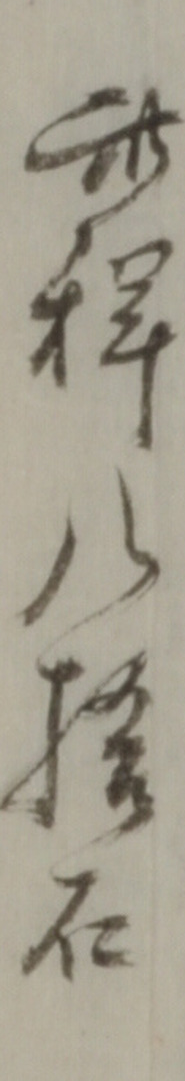此稈八拾石
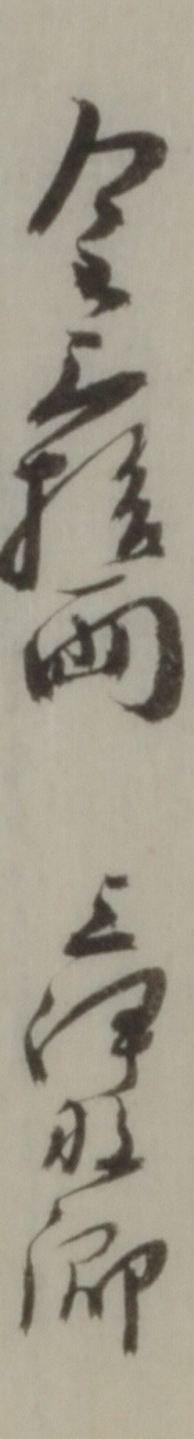金三拾両上伊那郷
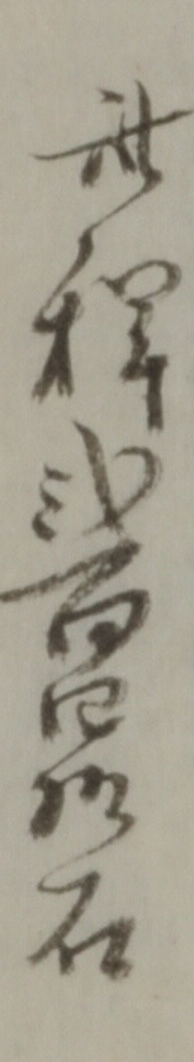此稈弐百四拾石
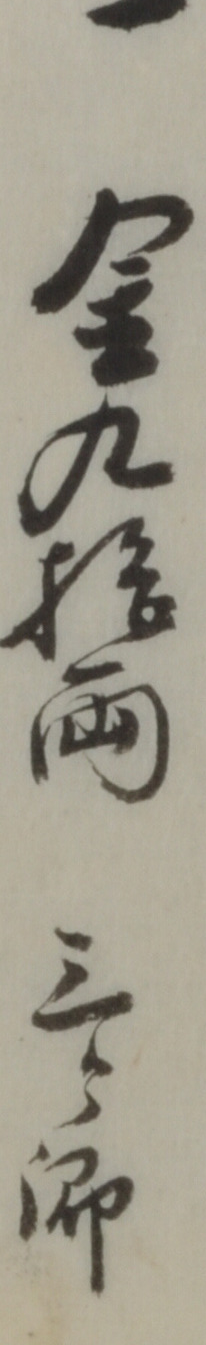一金九拾両三ヶ郷
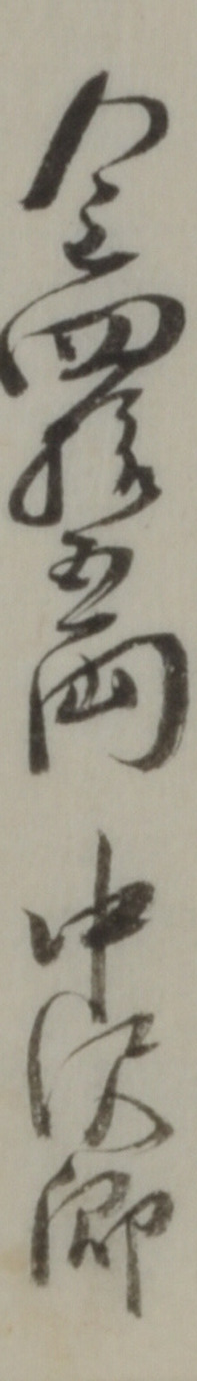金四拾五両中沢郷
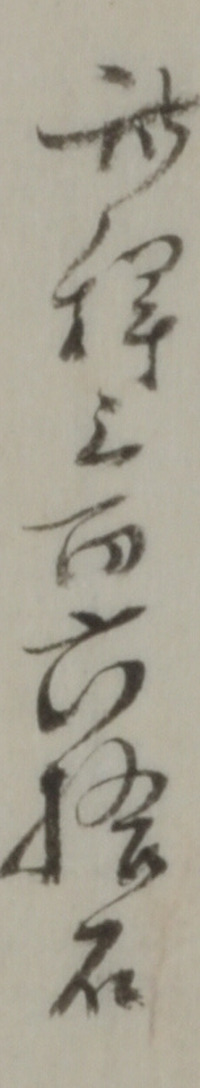此稈三百六拾石
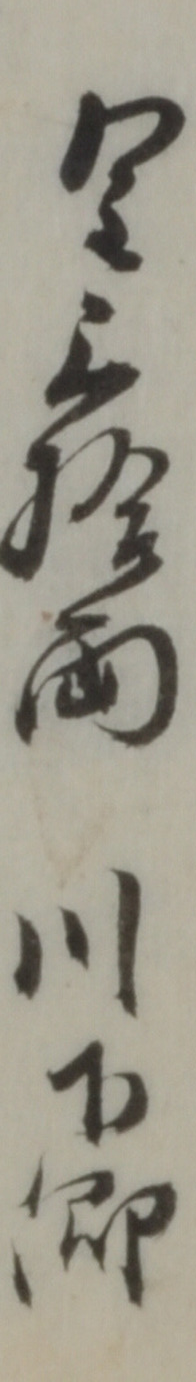金三拾両川下郷
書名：在町雑穀御買入大図
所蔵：伊那市立高遠町図書館・合同会社AMANE
